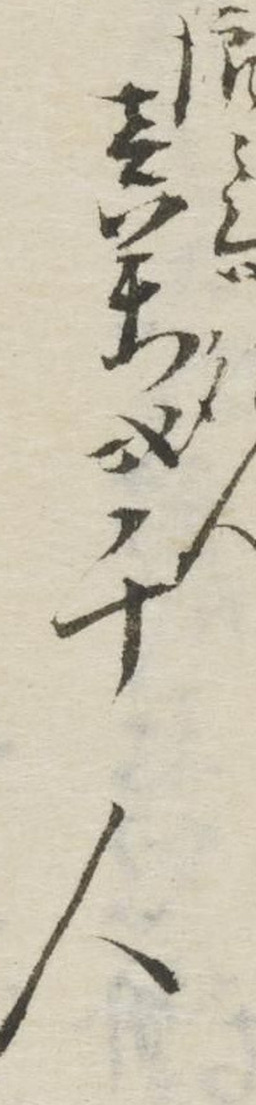壱萬弐千人
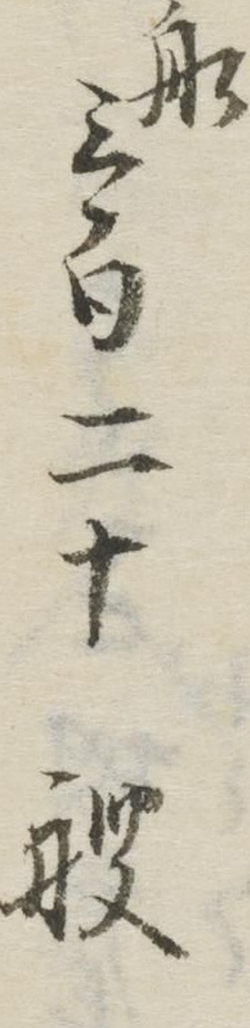三百二十艘
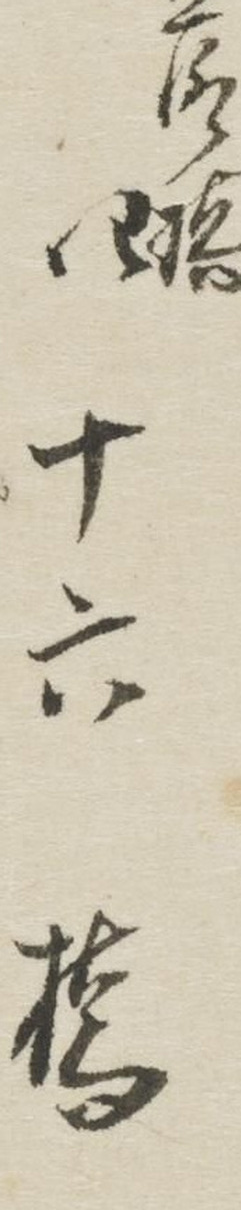四十六橋
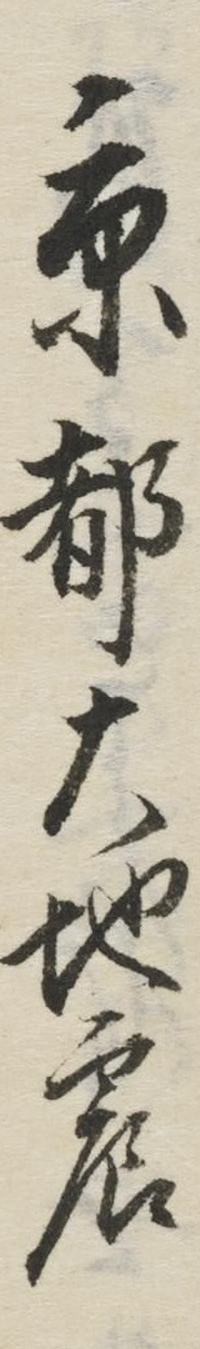京都大地震
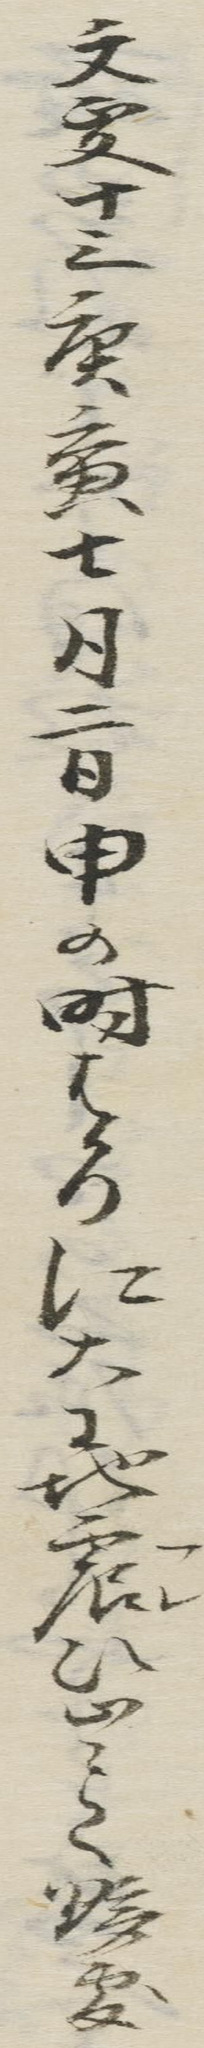文政十三庚寅七月二日申の時はかりに大に地震ひ出候夥敷
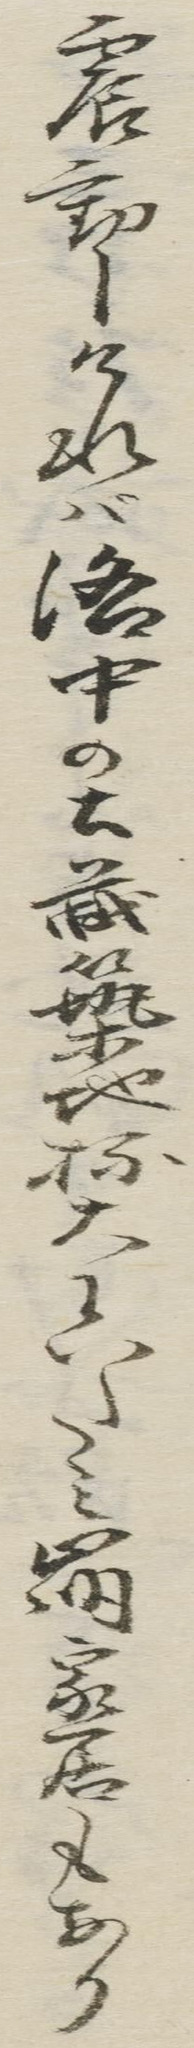震動しけれバ洛中の土蔵築地抔大にいたみ崩家居もあり
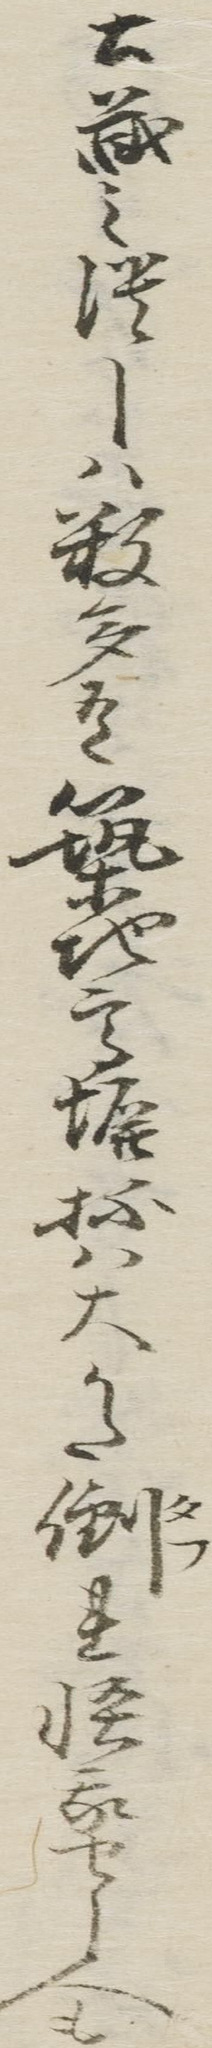土蔵之潰しハ数多有築地高塀抔ハ大かた倒れ怪我セシ人も
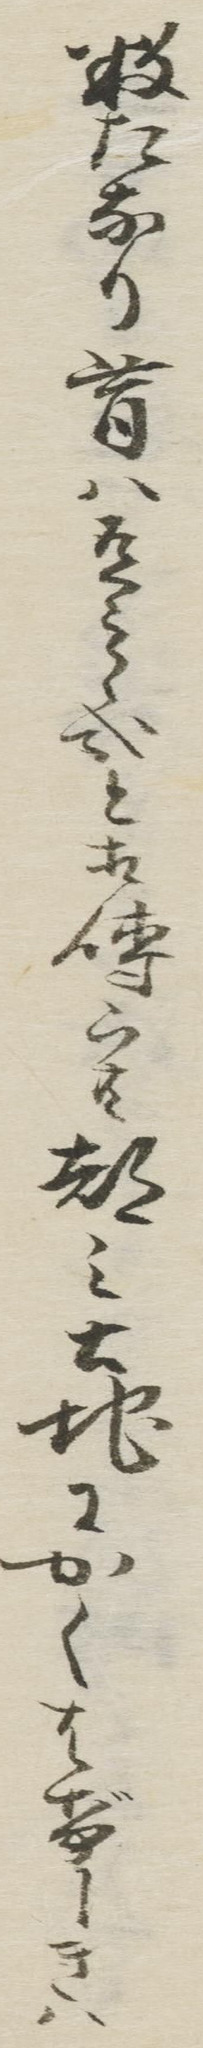数たなり昔ハ有之候哉と相傳候ヘ共都之大地にかくはげしきハ
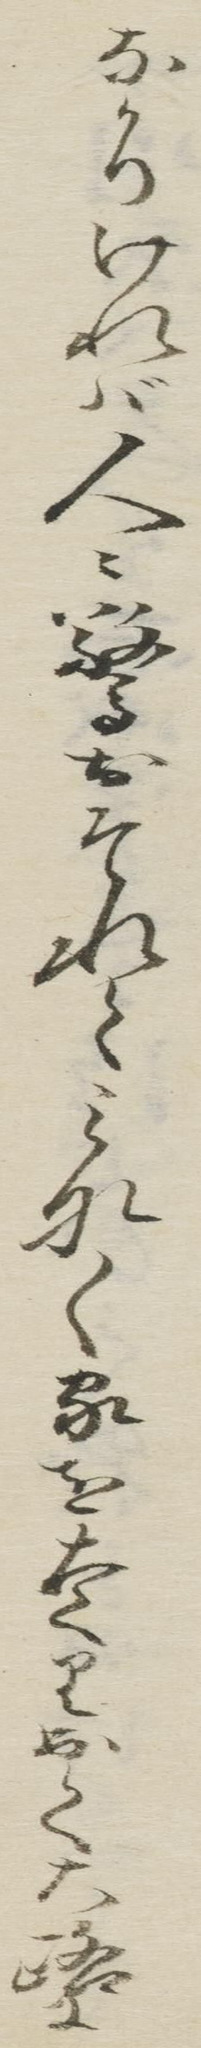なかりけれバ人々驚おそれてミ那〳〵家を走り出て大路に
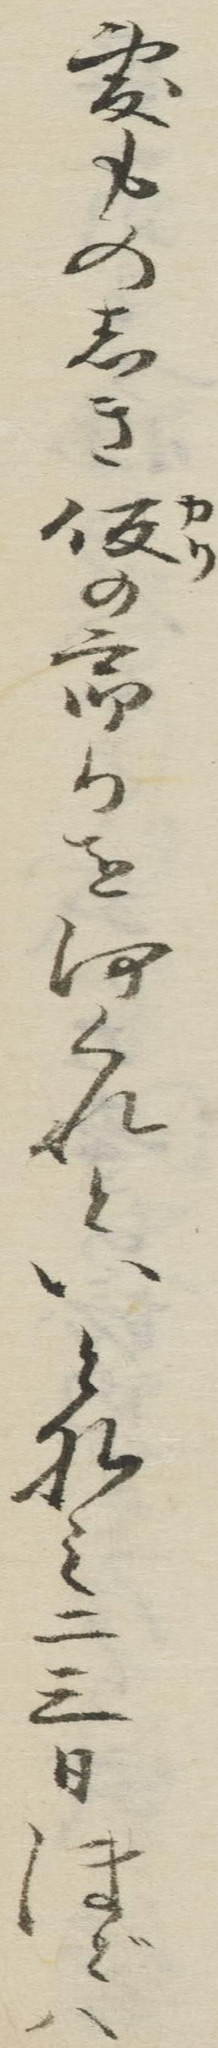敷ものしき仮のの宿りを何くれといと那ミ二三日ほどハ

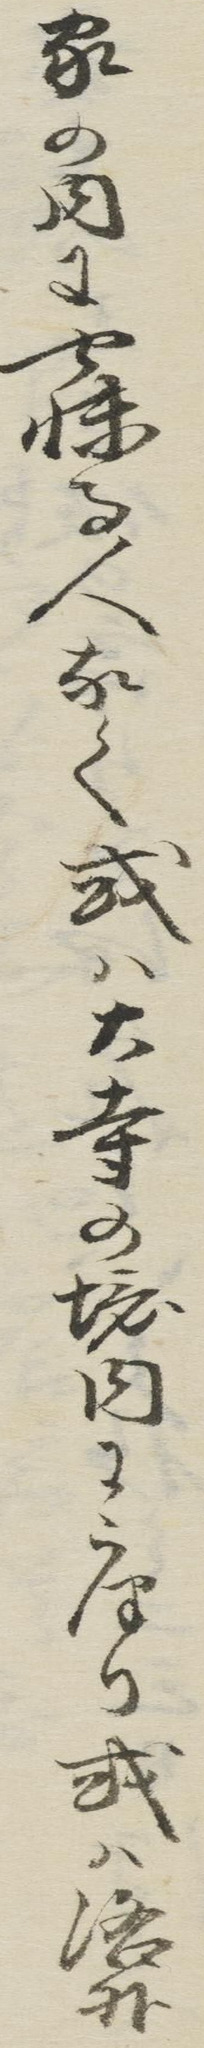家の内に寝る人なく或ハ大寺の境内に座り或ハ洛外
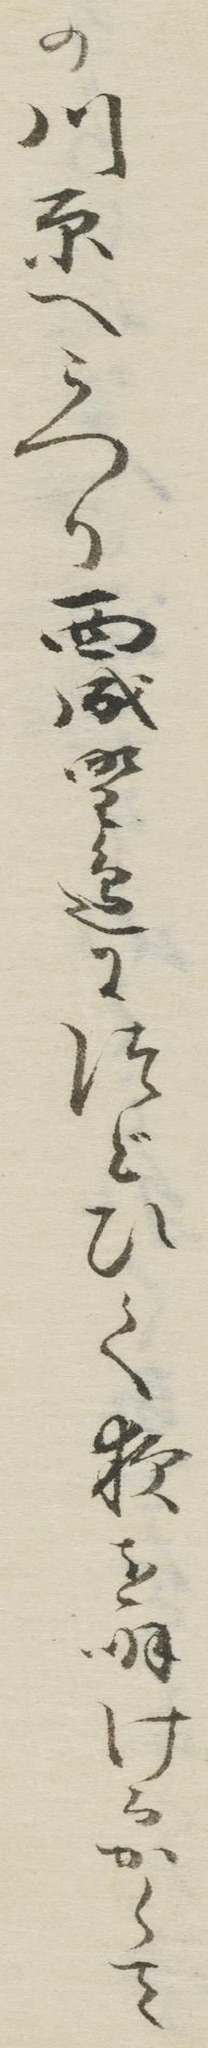の川原へうつり西成野辺につどひて夜を明けるかして
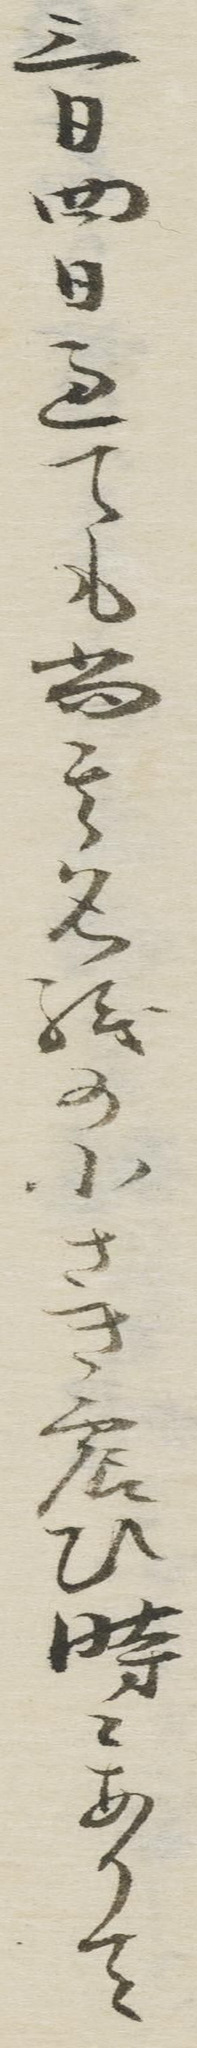三日四日過ても尚其名残の小さき震ひ時々ありて
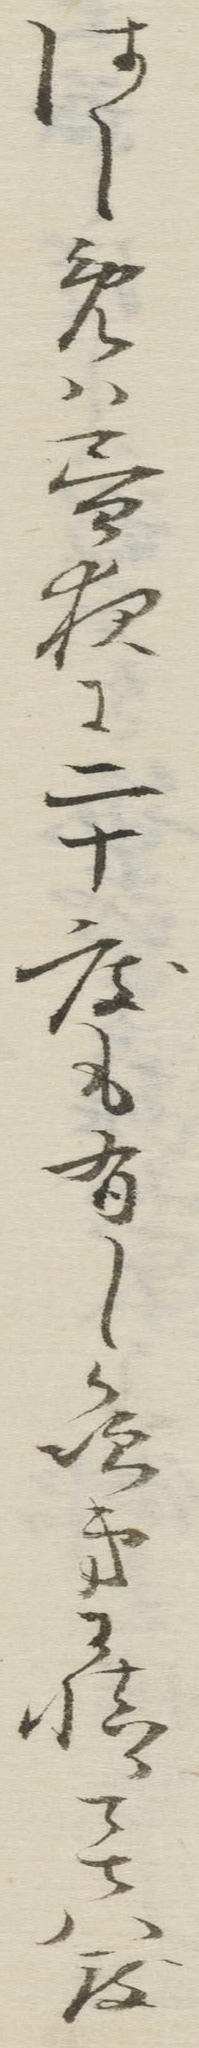はしめは昼夜に二十度も有しか次第に鎮候て七八度
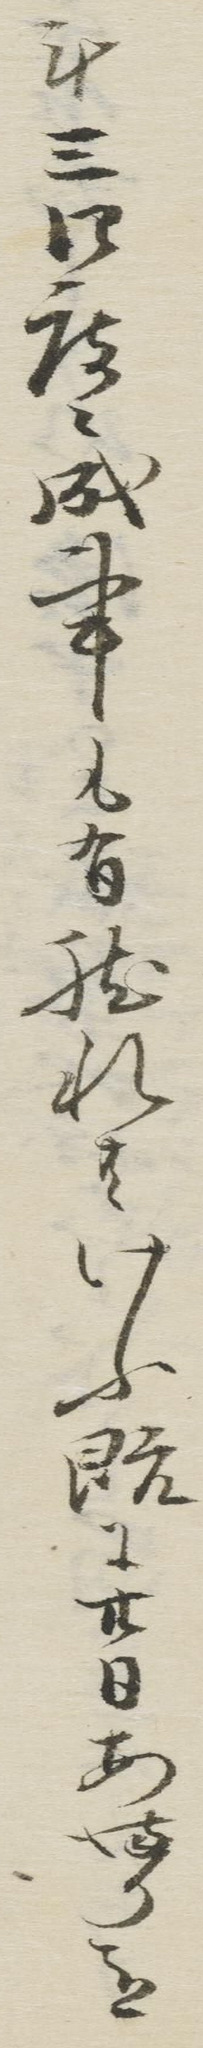斗三四度ニ成事も有然れ共けふ既に廿日あまりを
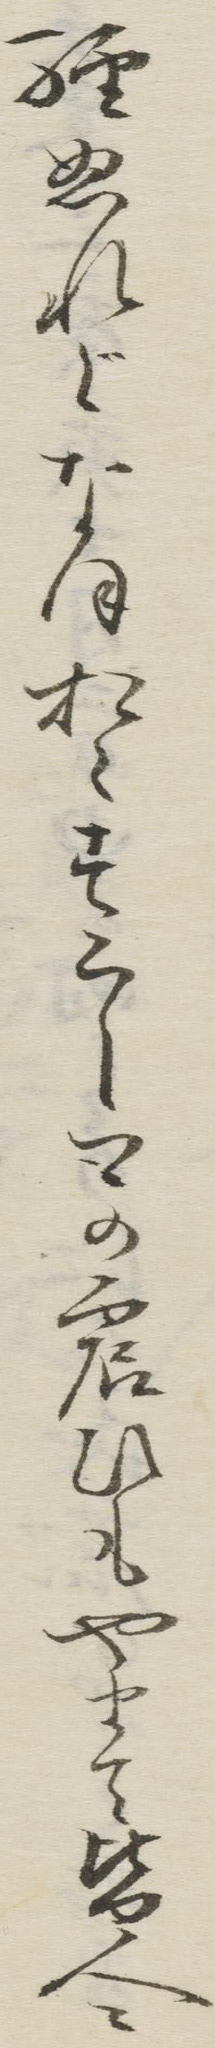経ぬればなほおゝすこしつゝの震ひもやまず皆人々
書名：諸国大地震大津波一代記
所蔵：東京大学地震研究所図書室 Earthquake Research Institute Library, The University of Tokyo, JAPAN
